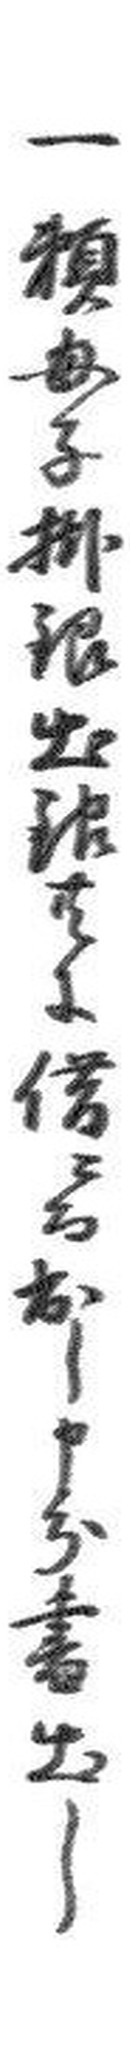一頼母子掛銀出銀共に借ニ而出し申分書出し
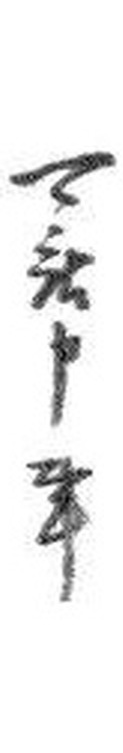可被申事
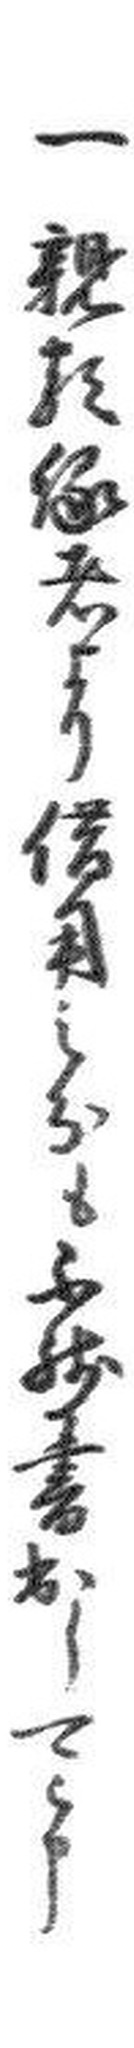一親類縁者より借用之分も不残書出し可被申
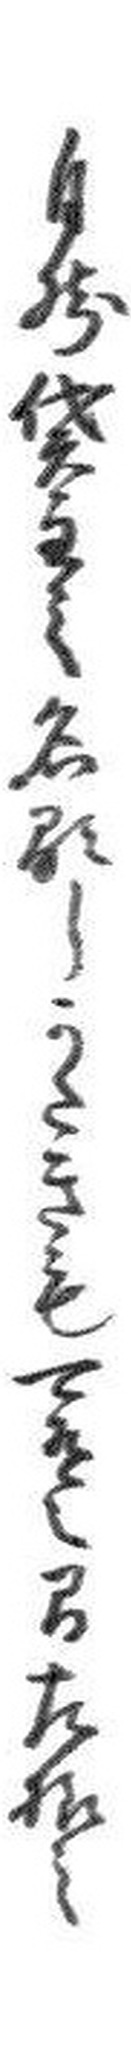自然貸主之名顕しかたきも可有之間左様之
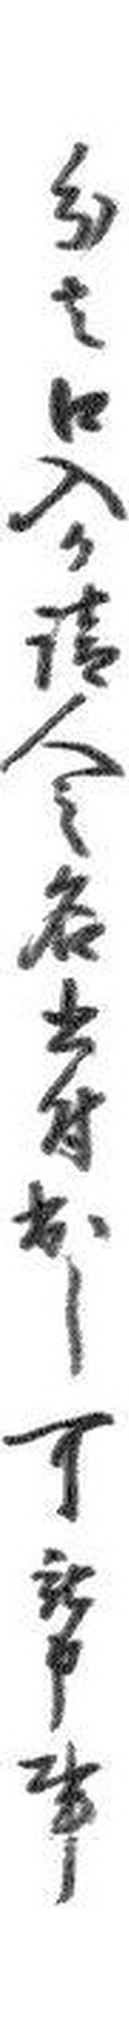分者口入か請人之名書付出し可被申事

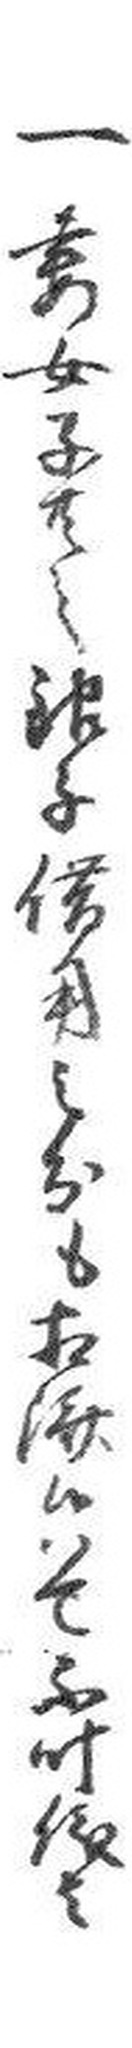一妻女子共之銀子借用之分も相済候はて不叶儀者
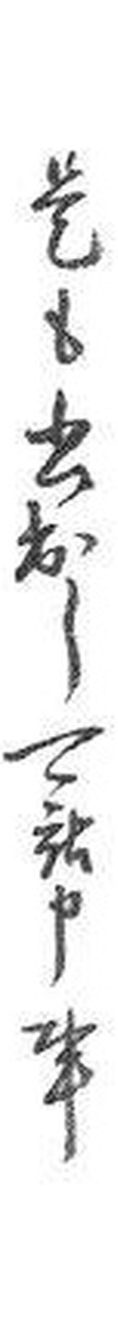是も書出し可被申事
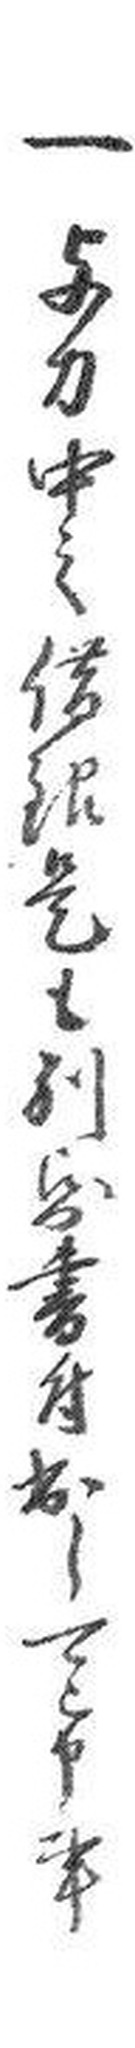一与力中之借銀是も別旨書付出し可被申事
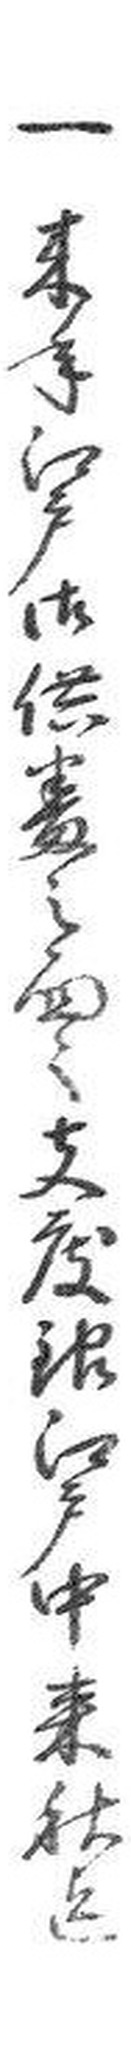一来年江戸御供番之面々支度銀江戸中来秋迄
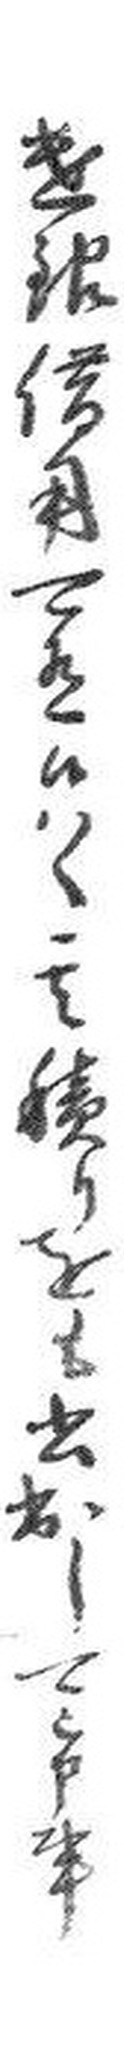遣銀借用可有候はゝ其積りをも書出し可被申事
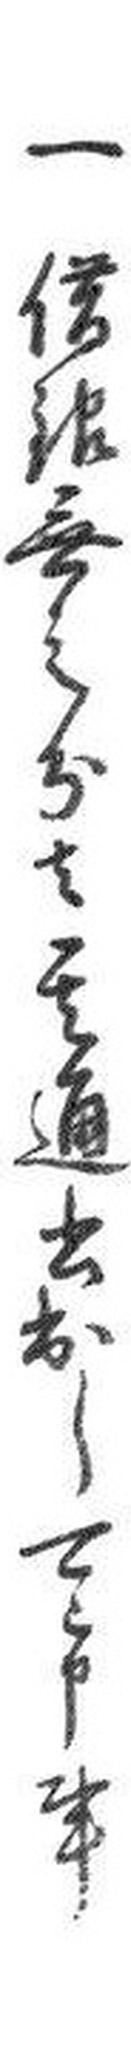一借銀無之分者其通書出し可被申事
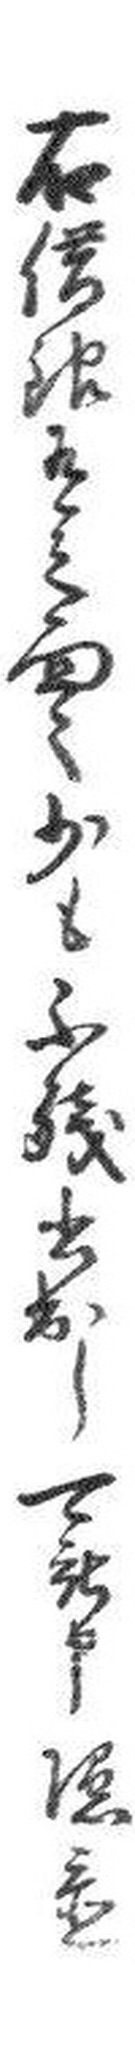右借銀有之面々少も不残書出し可被申隠置
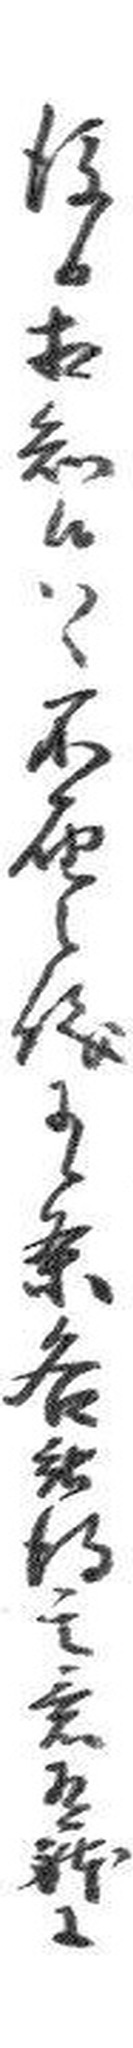後日相知候はゝ不届之儀に候条各被得其意有体に
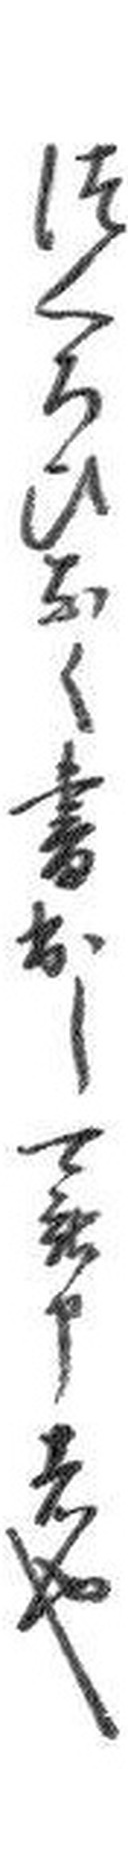つくろひなく書出し可被申者也
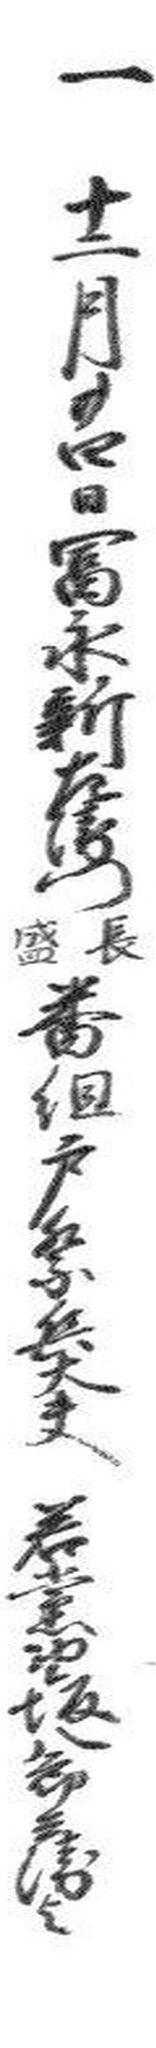一十二月廿四日冨永新左衛門長盛番組戸祭兵太夫若党野坂八郎兵衛と
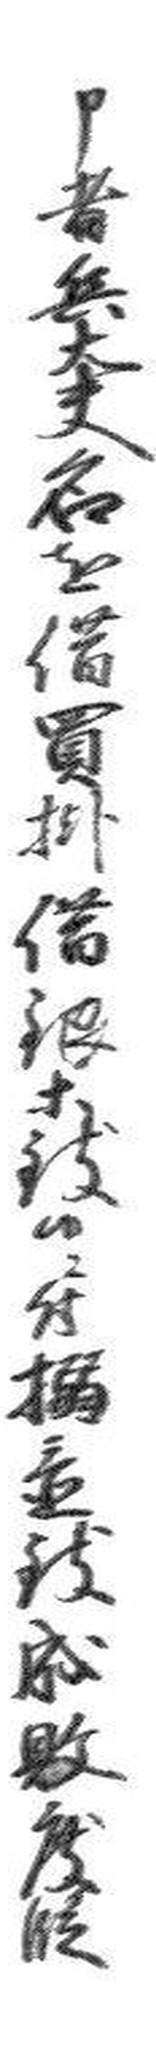申者兵太夫名を借買掛借銀等致候ニ付搦置致成敗度段
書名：家譜 八 光通公 従寛文十年到同十二年
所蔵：福井県文書館 Fukui Prefectural Archives
